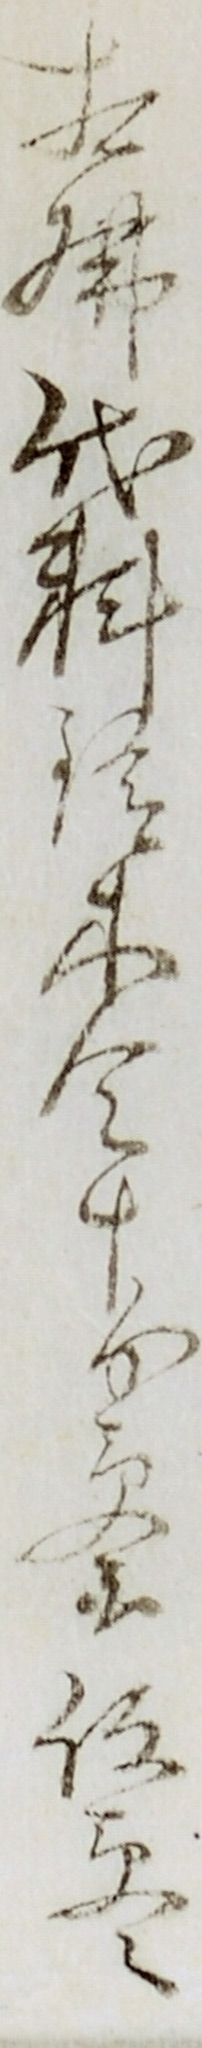相払代料鈴木金十ゟ受取仮受之
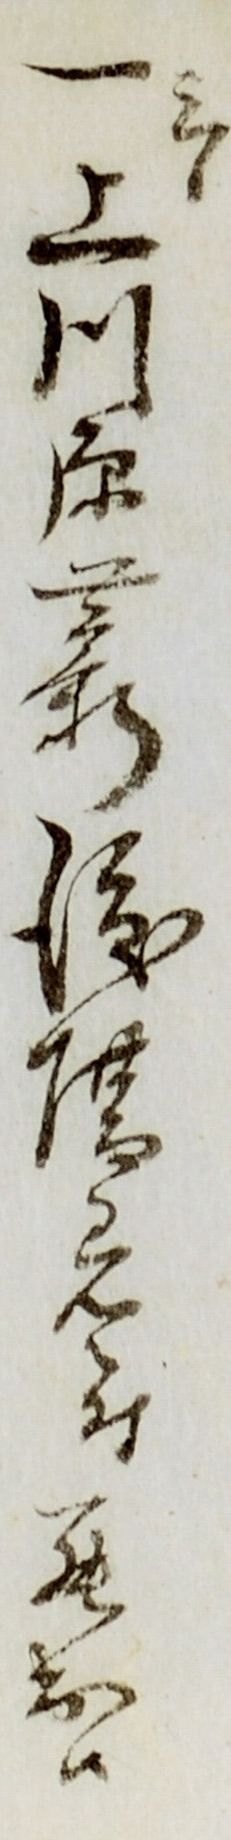一上川原薪渡場着に付罷出候
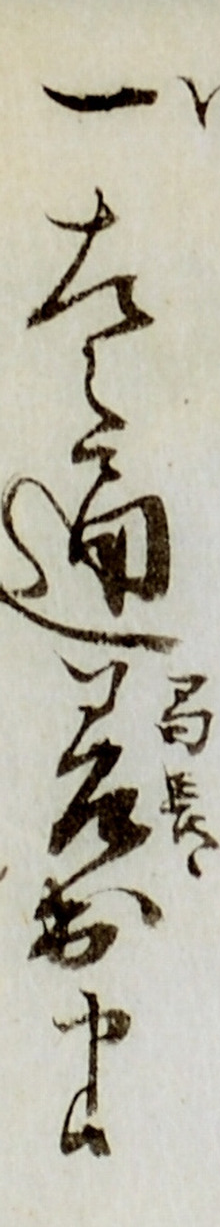一左之通差出申候
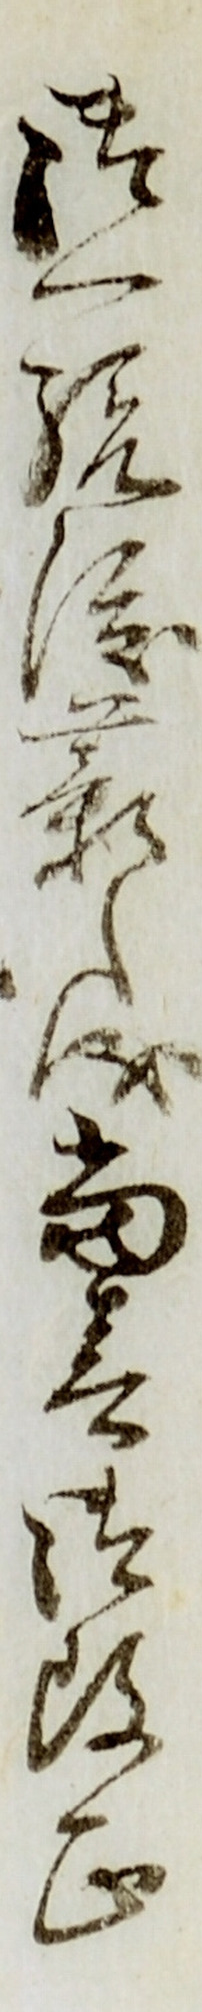御一統渡薪之儀当春御改正
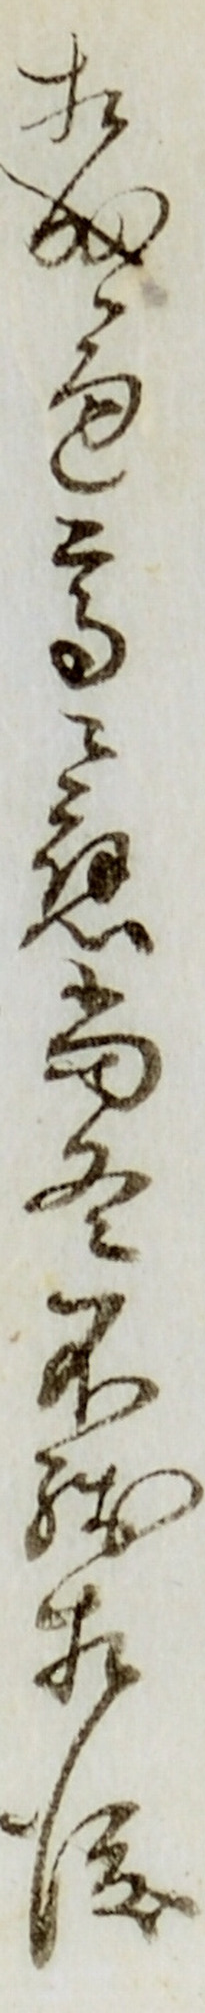相成候通高に応当冬不残相渡
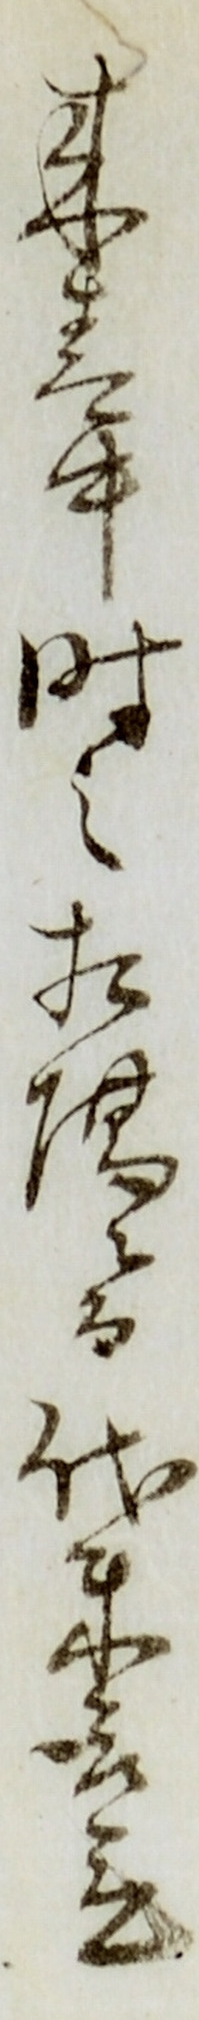来春中時之相場にて代米取立
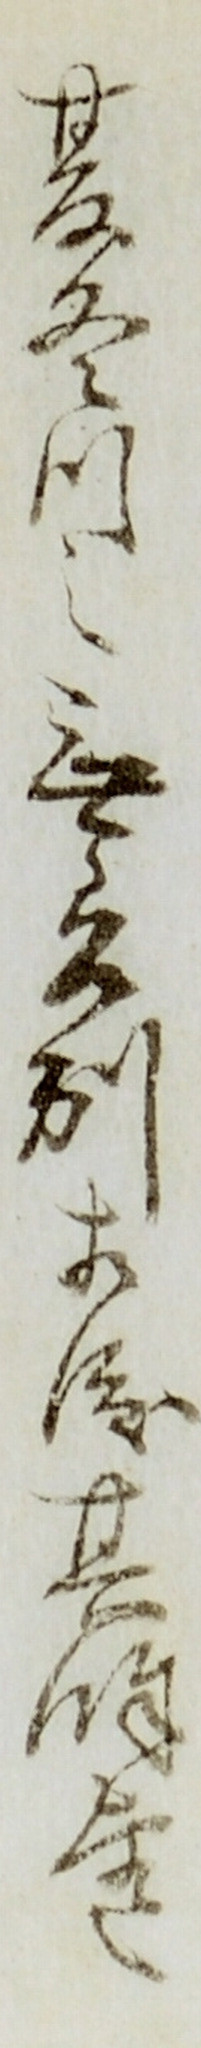夏冬川之無差別相渡其余望之
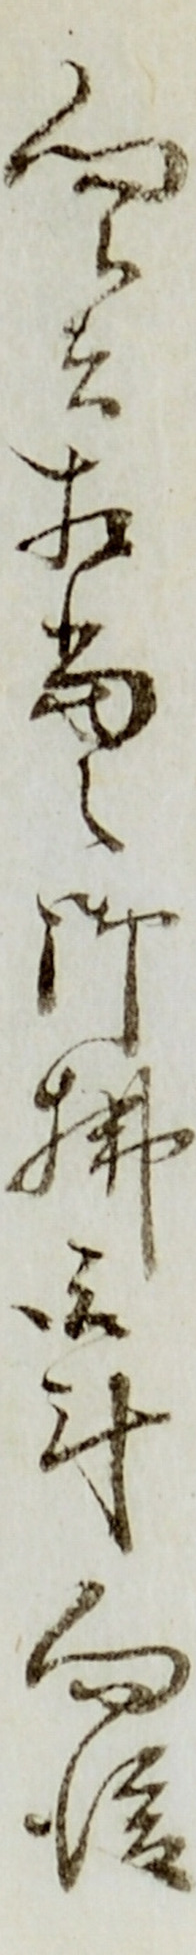向えは相当之御払取計向後
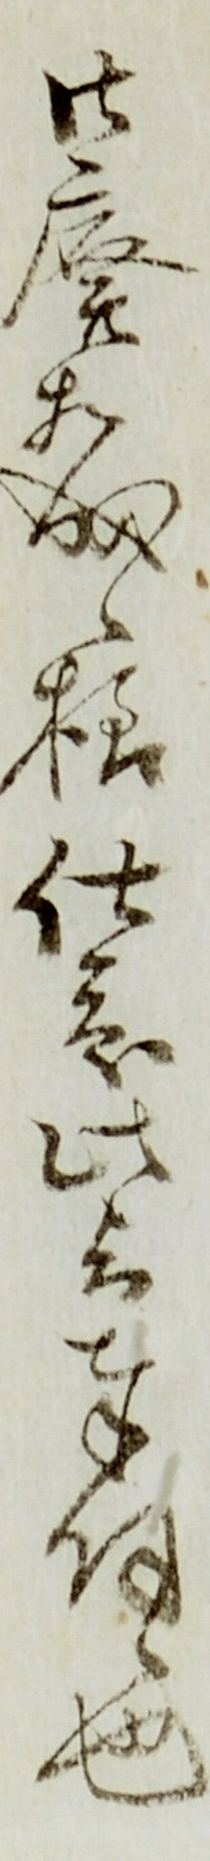御廃相成候様仕度此旨奉伺候也
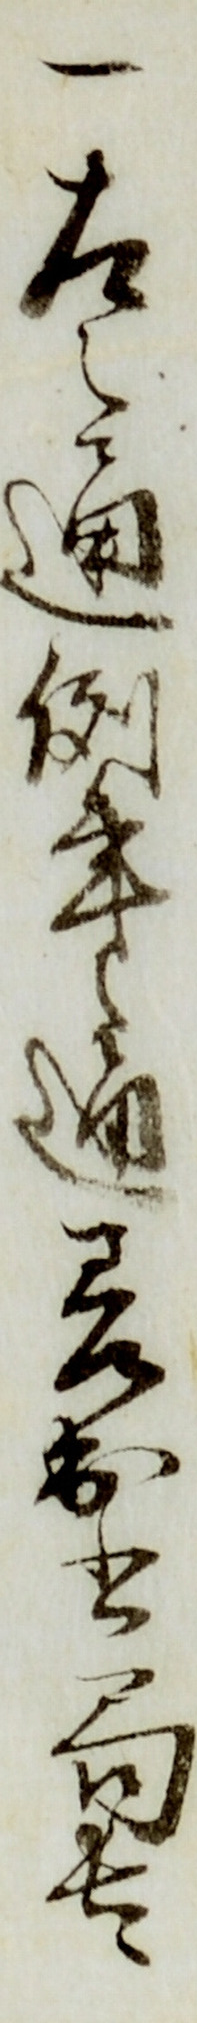一左之通例年之通差出書局長へ

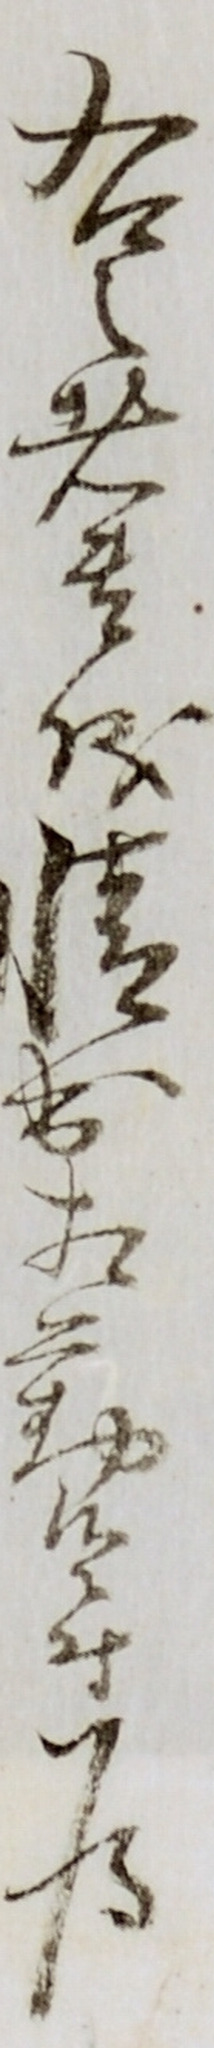右之者共儀情出相勤候に付為
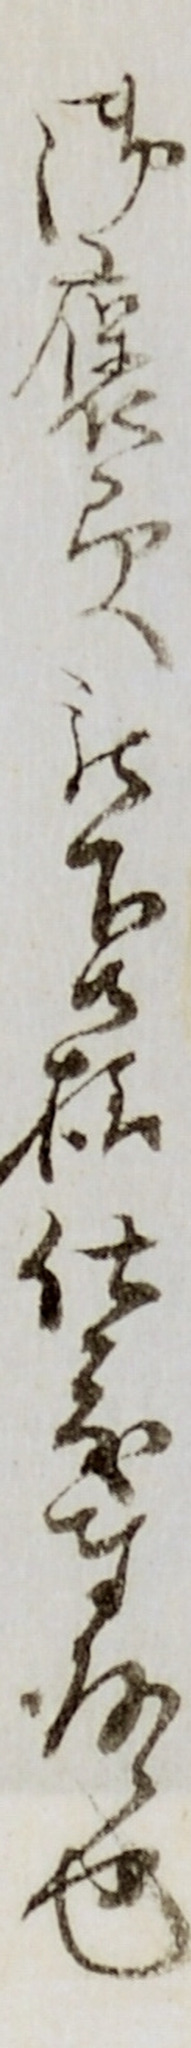御褒美被下候様仕度奉存候也
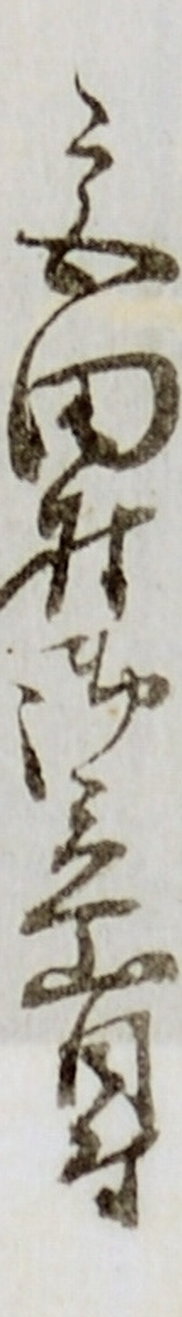宮田村御立山目付
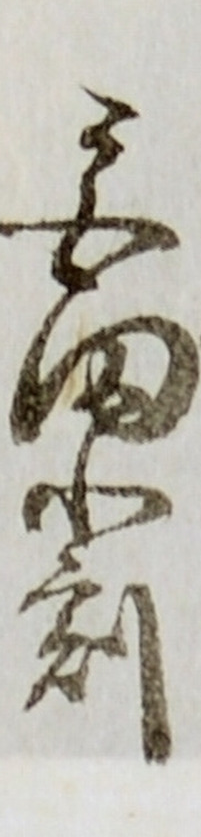宮田北割
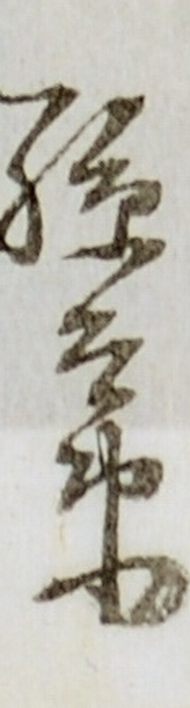太兵衛
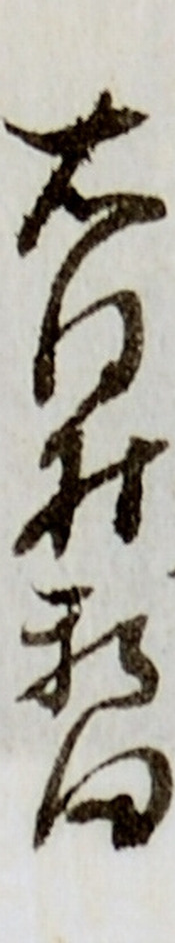右同村和田
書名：山林方諸事御用留
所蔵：伊那市立高遠町図書館・合同会社AMANE
